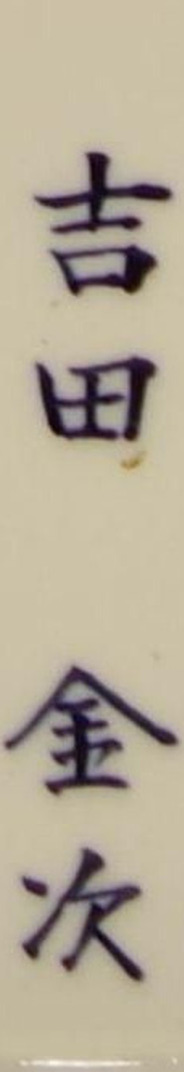吉田金次
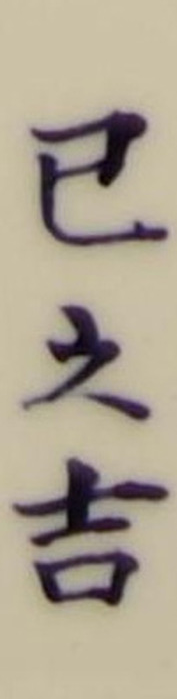巳之吉
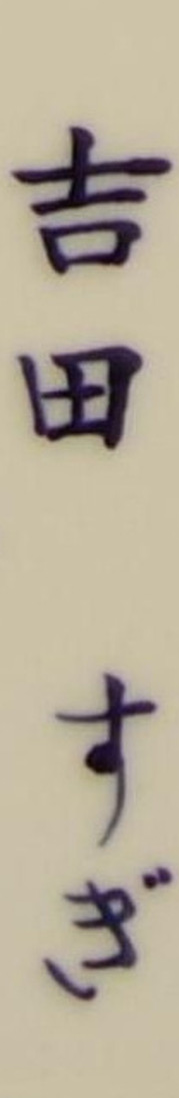吉田すぎ
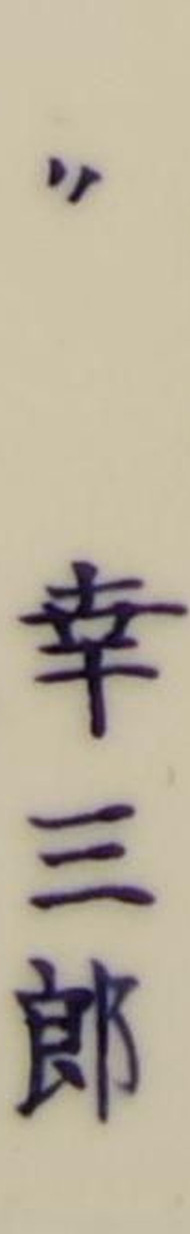幸三郎
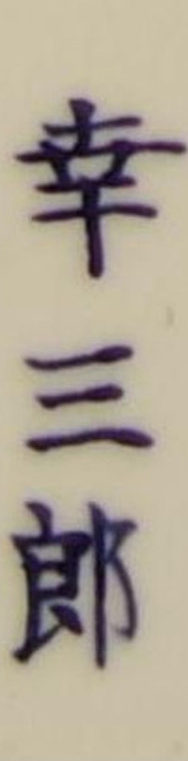幸三郎
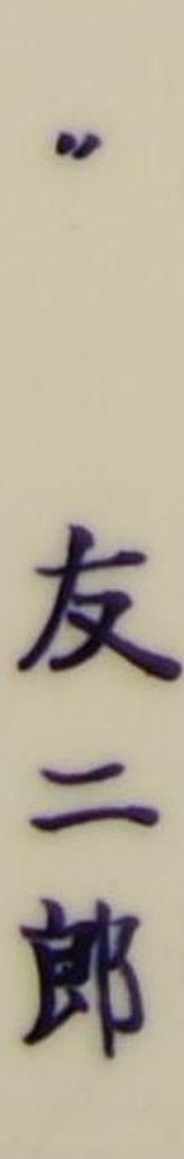友二郎
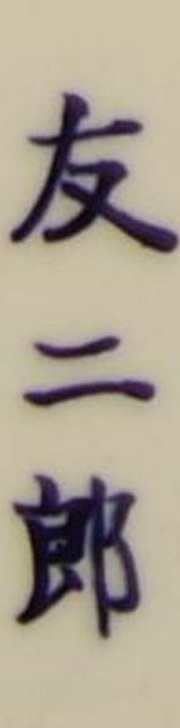友二郎

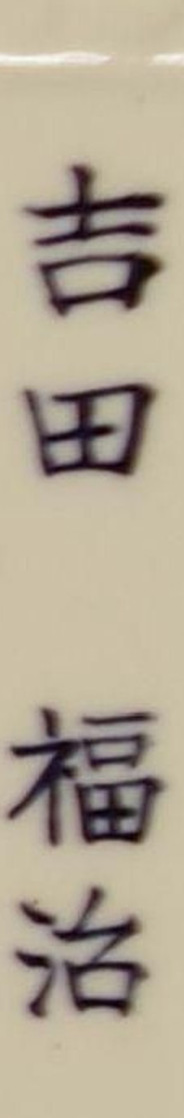吉田福治
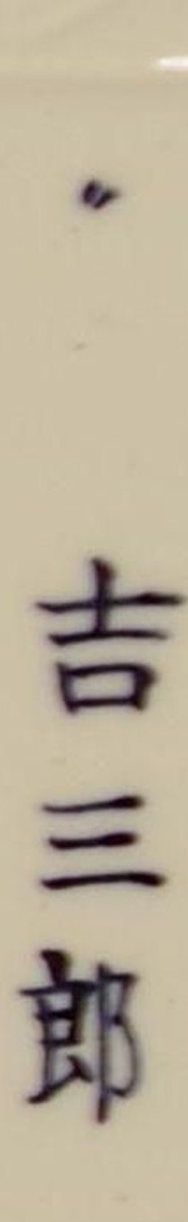吉三郎
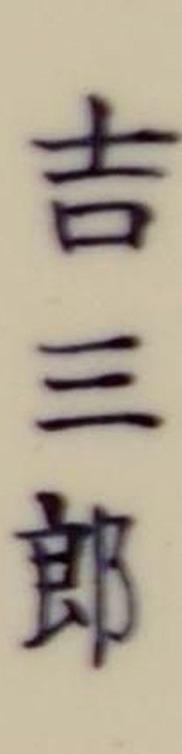吉三郎
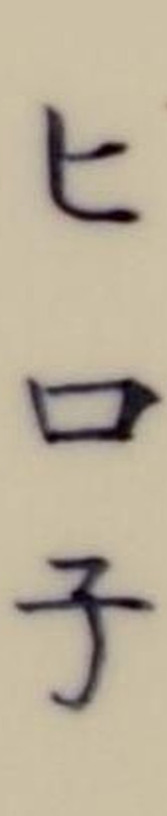ヒロ子
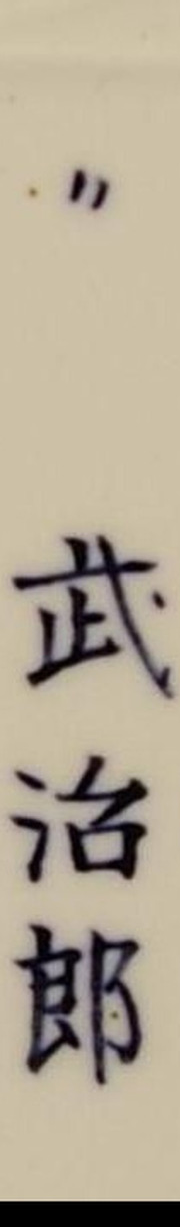武治郎
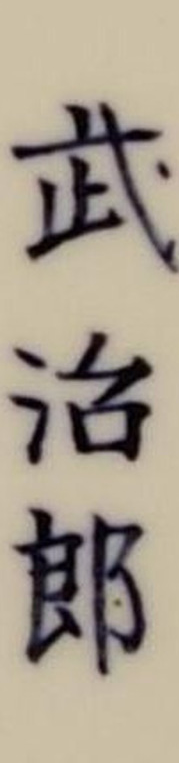武治郎
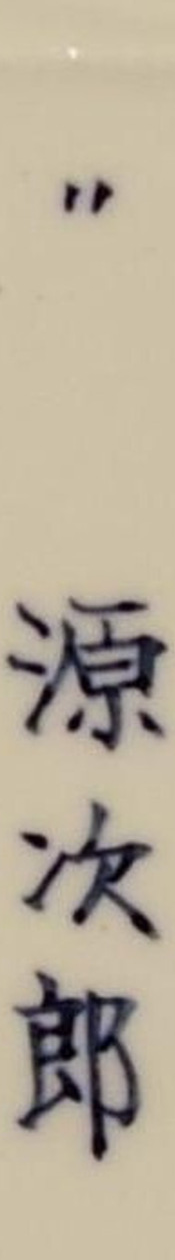源次郎
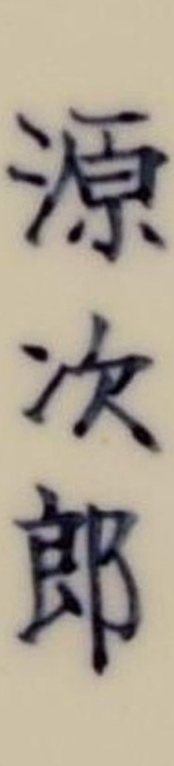源次郎
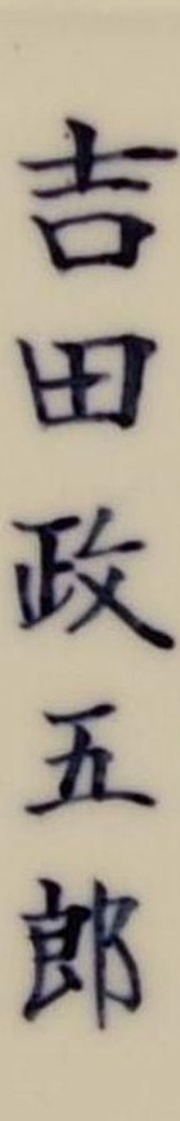吉田政五郎
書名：E~L
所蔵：高野山金剛峯寺
